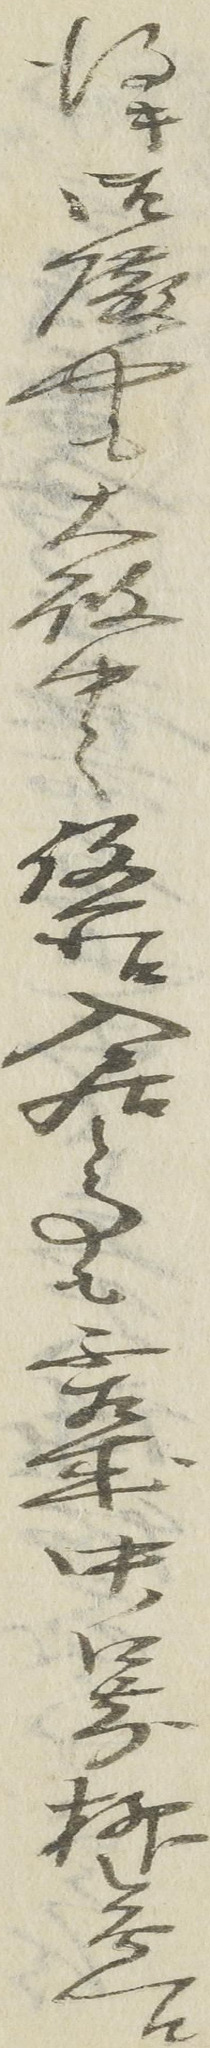得キ御殿中も大破中々役所江入居候事も不相成中ノ口前柳之辺江
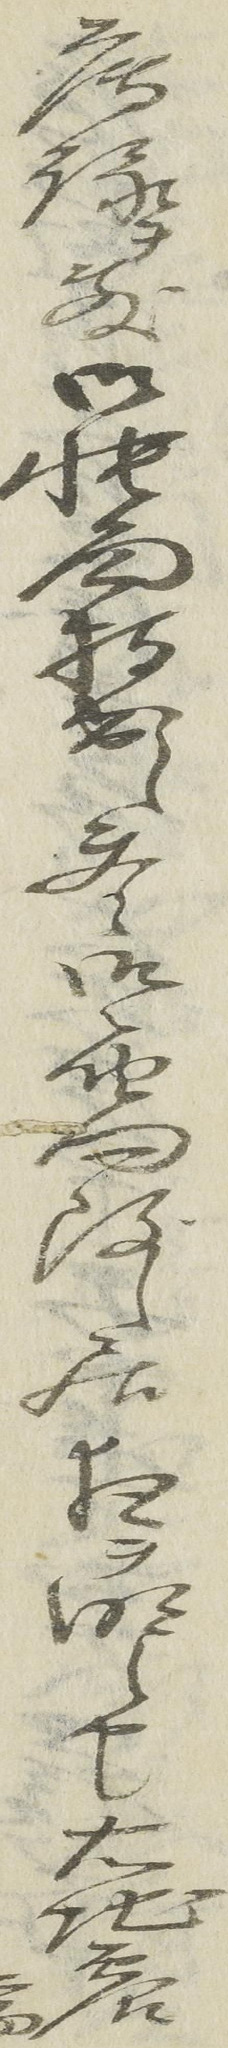広縁ヲ敷御帳面持出し夫〻御届向致し居夜ヲ明し申し候右地震ニ而

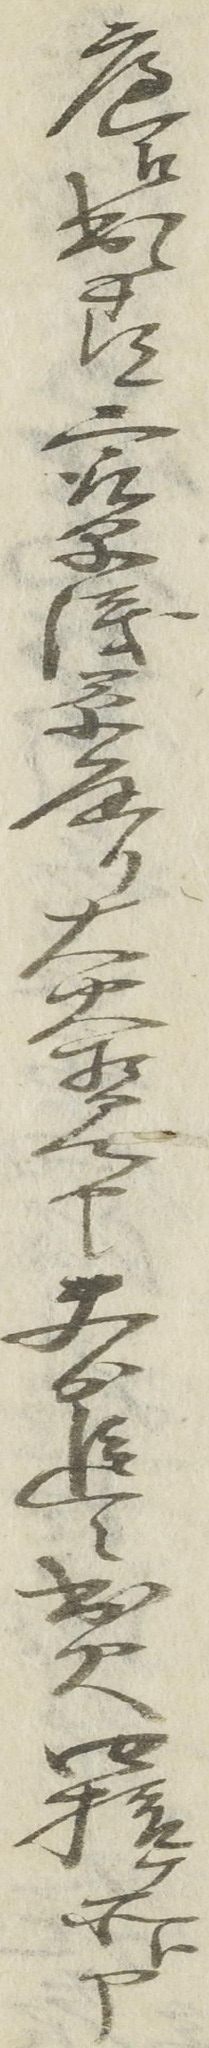庭江出候節最早浅草通り大火相見申候夫ゟ追〻出火四拾ケ所ト申
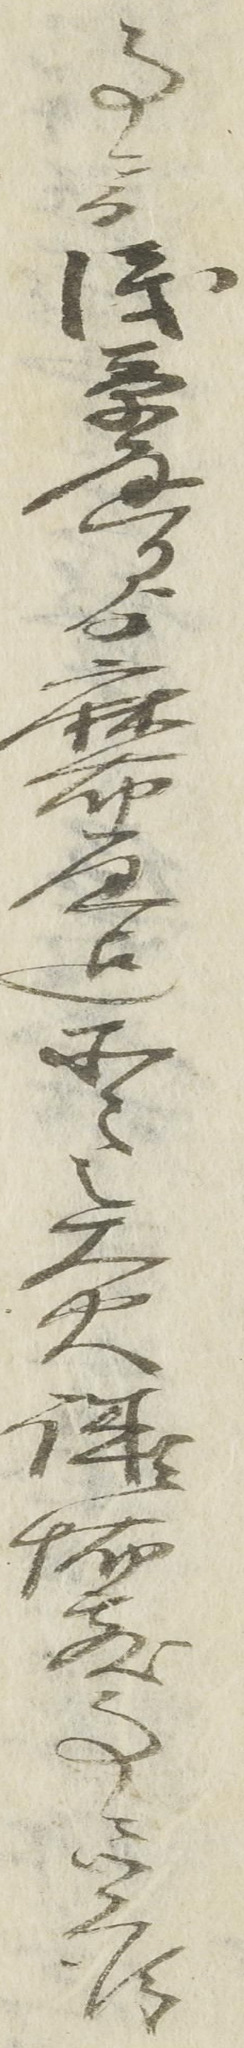事ニ而浅草通りゟ麻布通迄所〻之大火誠ニ怖敷事ニ御座候
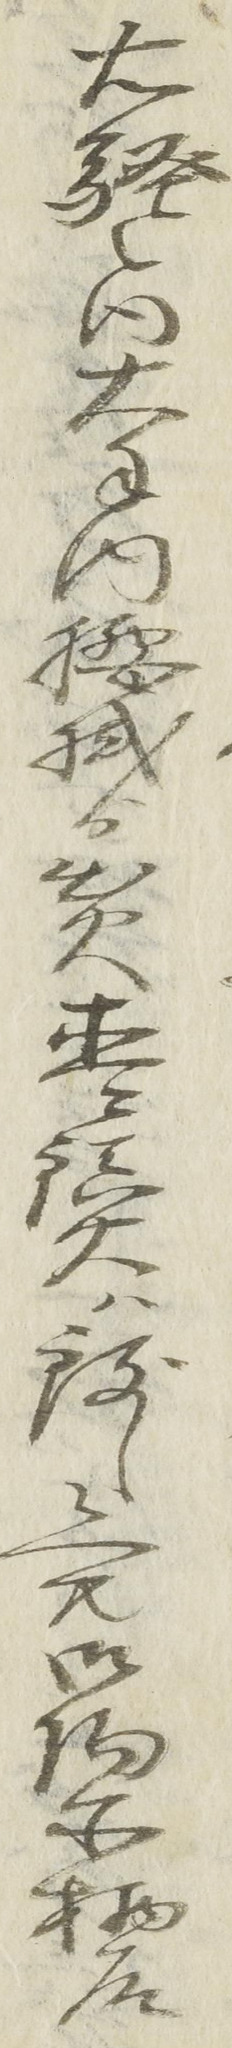右騒之内大手門腰掛ゟ出火直ニ鎮火ハ致し候へ共御場所柄故
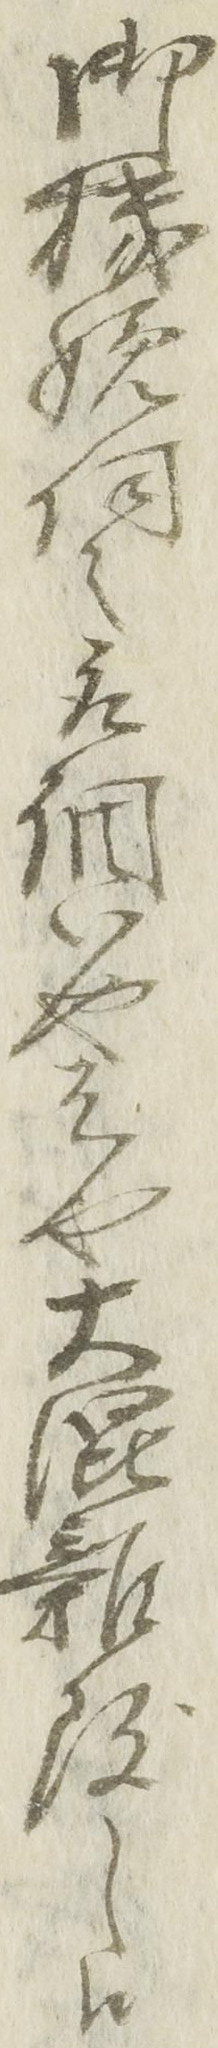御機嫌伺之取調いやはや大混雑致し候
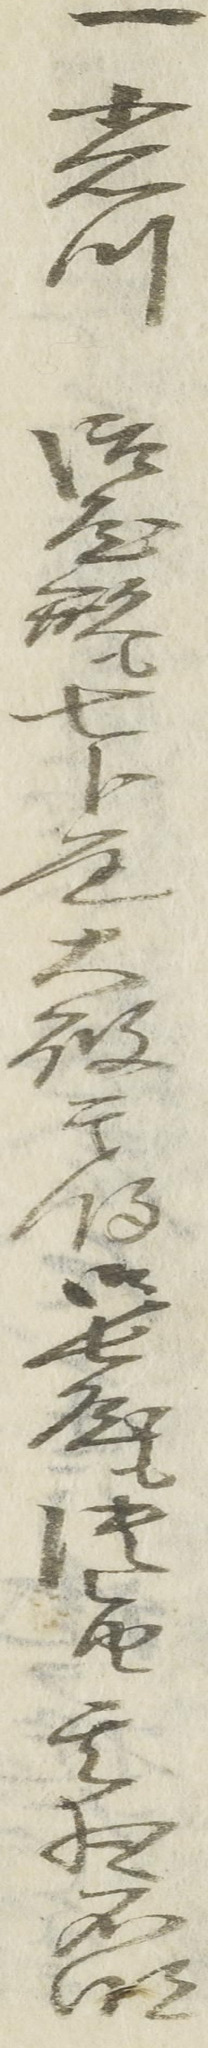一小石川御屋形も七分通大破其余御長屋も潰候由其夜不明
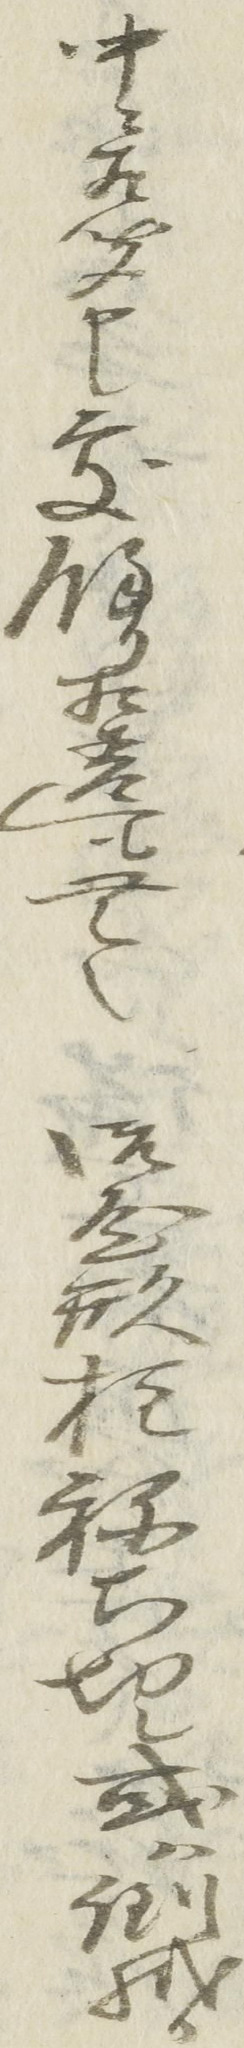中ニ相聞申候処余り相違も無之御屋形柱ねち切レ或ハ倒掛り
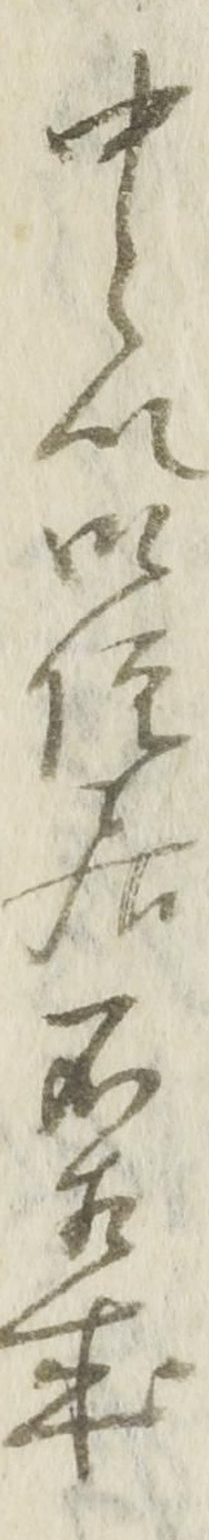中〻以御住居不相成
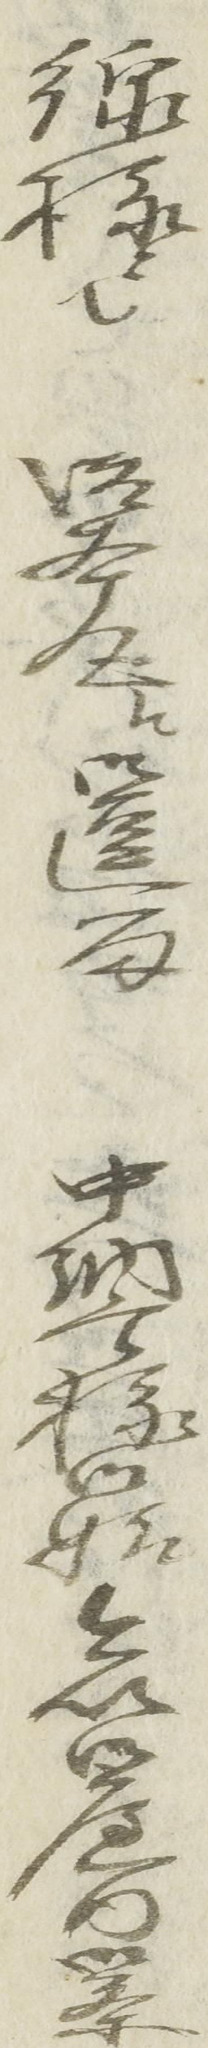線様ニも御本丸江御逗留中納言様御始今以御庭内御茶
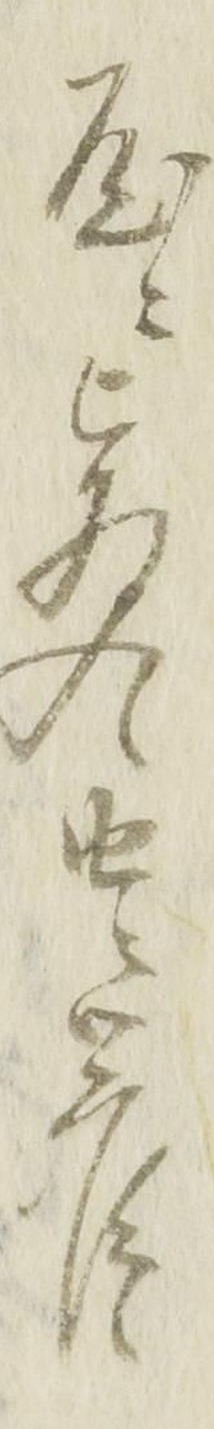屋ニ被為入候由ニ御座候
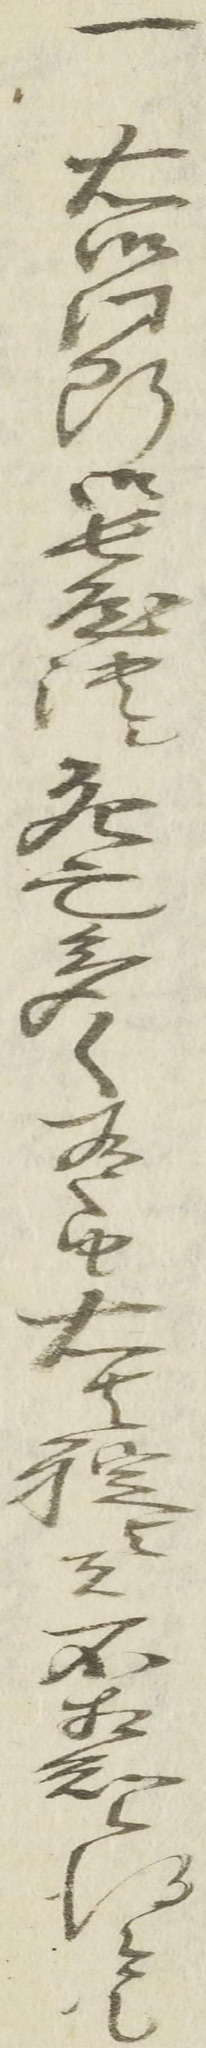一右御同断御長屋潰レ死亡多く有之由右ハ聢とは不相知候得とも
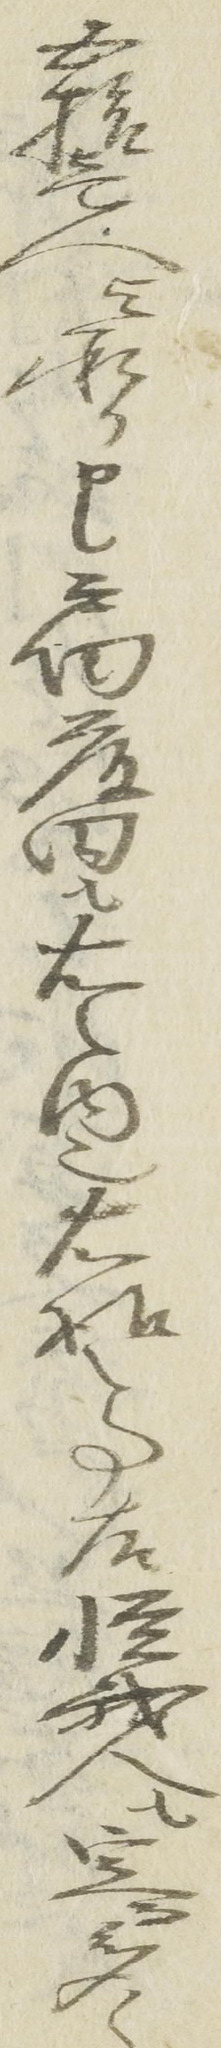五拾壱人と承り申候戸田藤田も右之内也右様之事故怪我人も定而多く
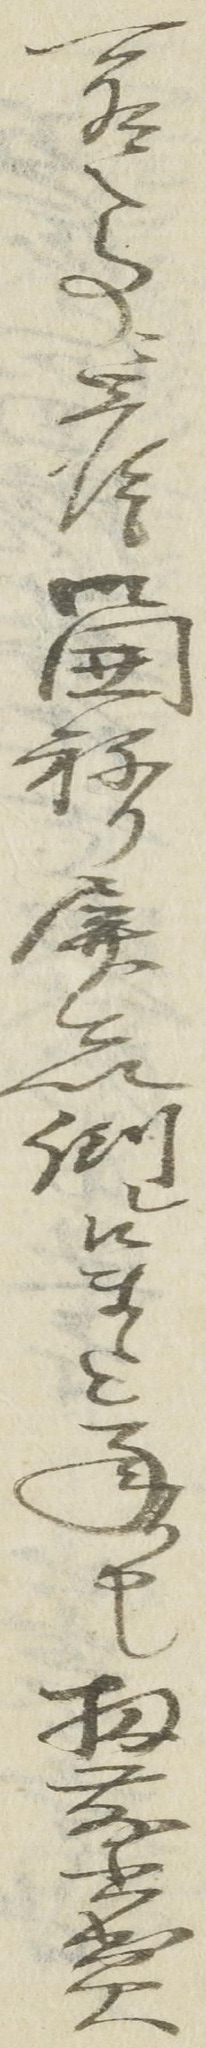可有之事ニ御座候御囲ねり屏今以倒レ候まゝと承り申候扨前書出火
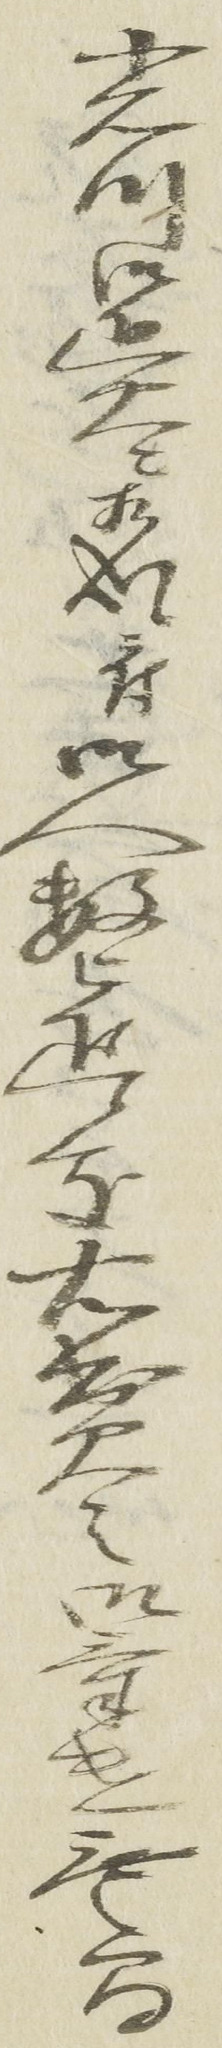小石川御近火ニ相成ニ付御人数被返候処右出火之御気遣無之間
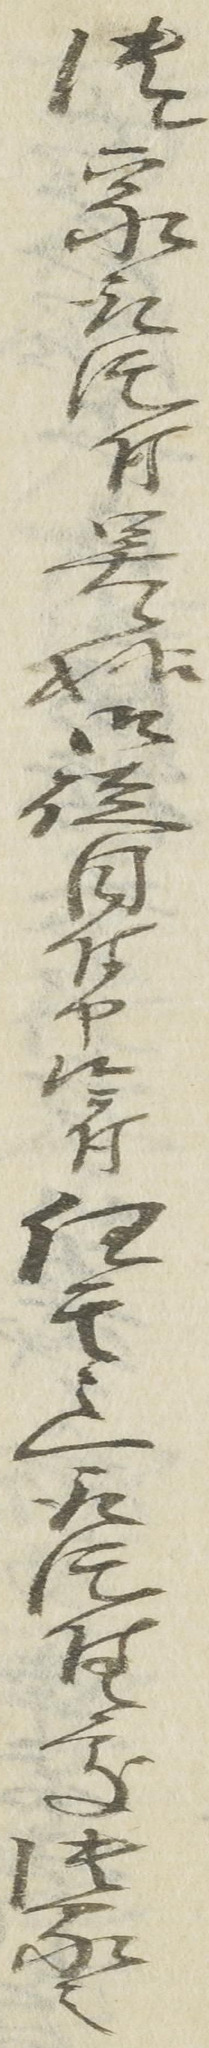潰家取片付呉候様御徒目付申候ニ付任其意取片付候処潰家之
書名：安政乙卯江戸大地震筆記　安政丙辰八月大阪大雷雨之記追加　安政三辰年七月松前辺大地震并八月大風雨記録
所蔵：東京大学地震研究所図書室 Earthquake Research Institute Library, The University of Tokyo, JAPAN
